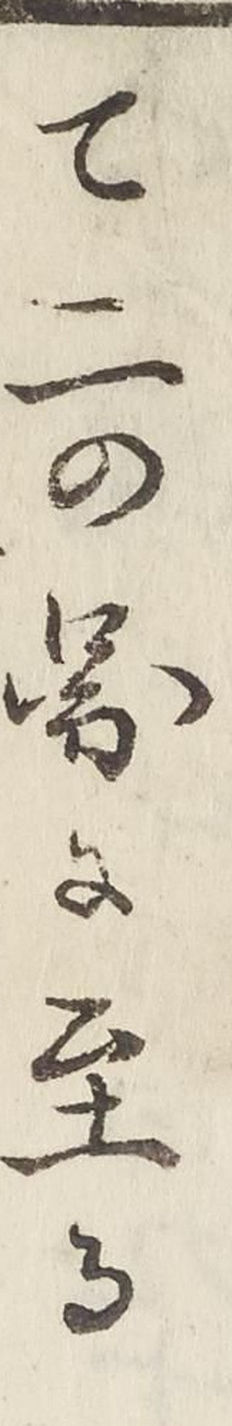て二の図に至る
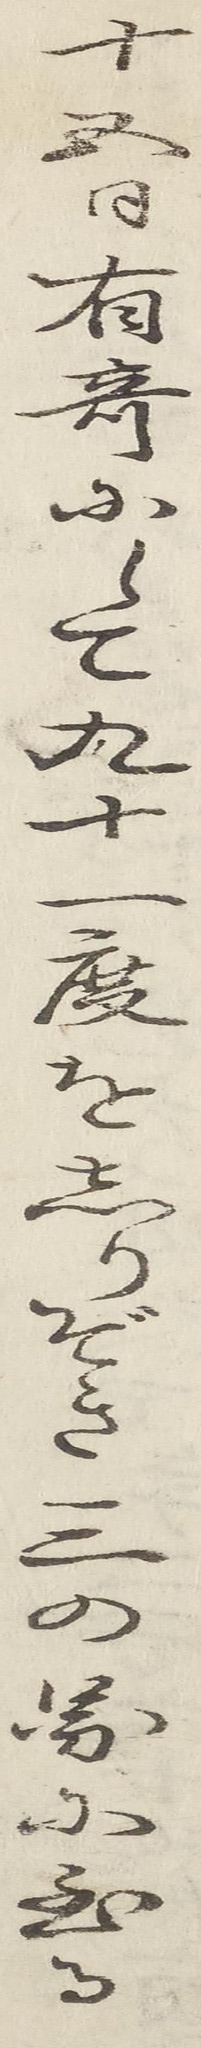十五日有奇にして九十一度をしりぞき三の図に至る

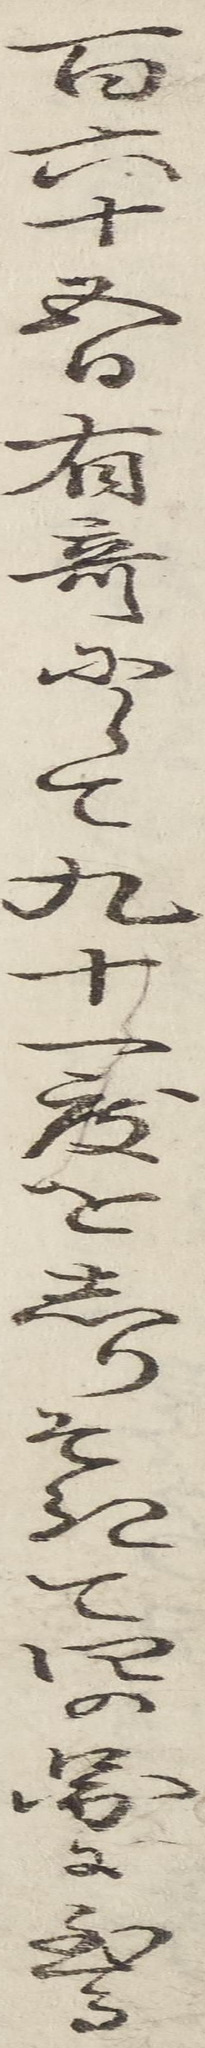百六十五日有奇にして九十一度をしりそきて四の図に至る
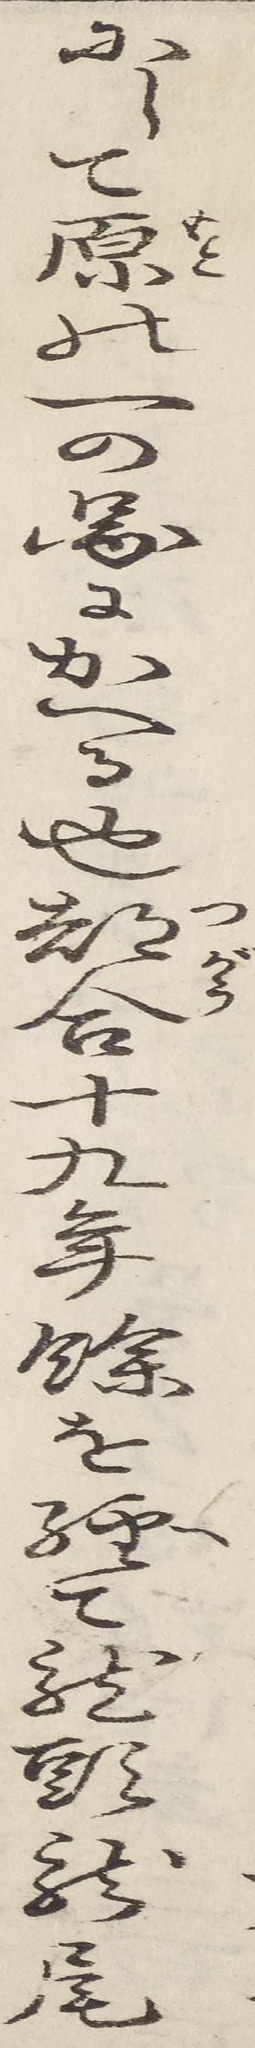にして原の一の図にかへる也都合十九年余を経て龍頭龍尾
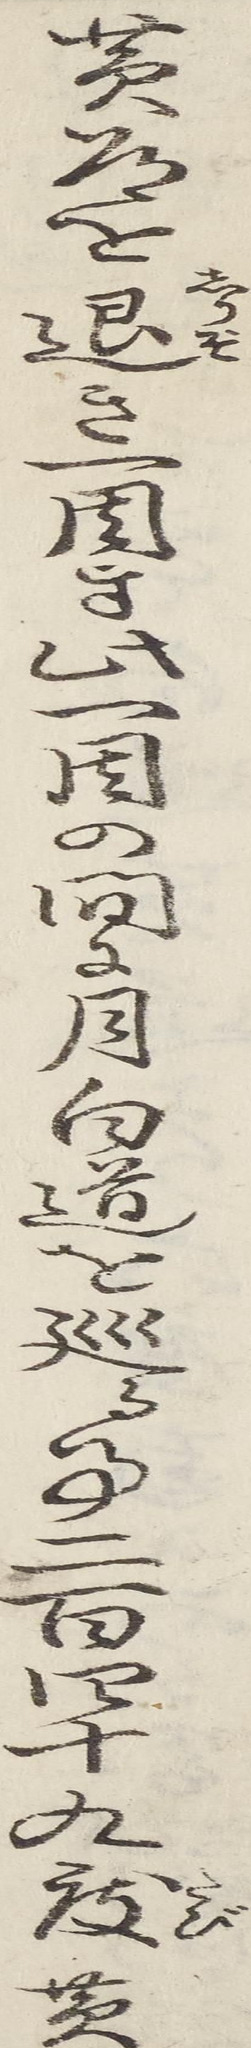黄道を退き一周す此一周の間に月白道を巡る事二百四十九度黄
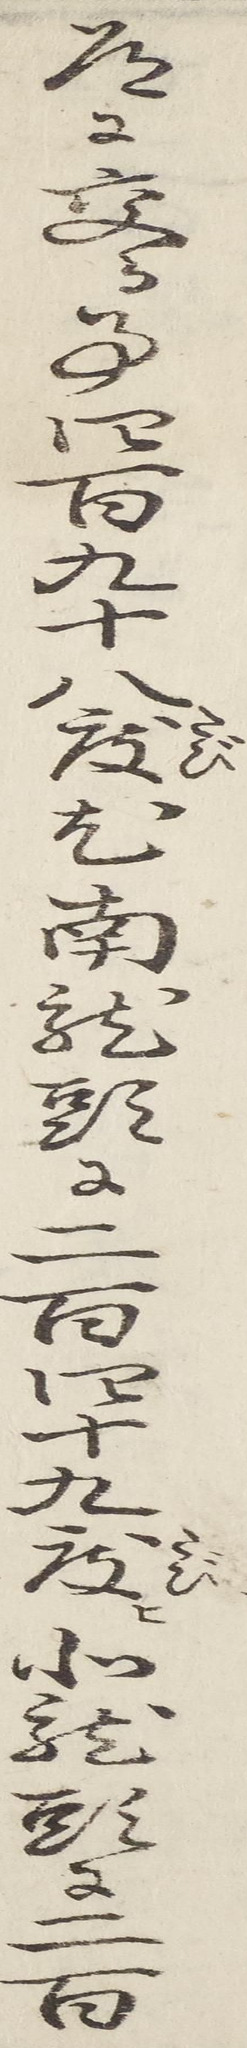道に交る事四百九十八度尤南龍頭に二百四十九度北龍頭に二百
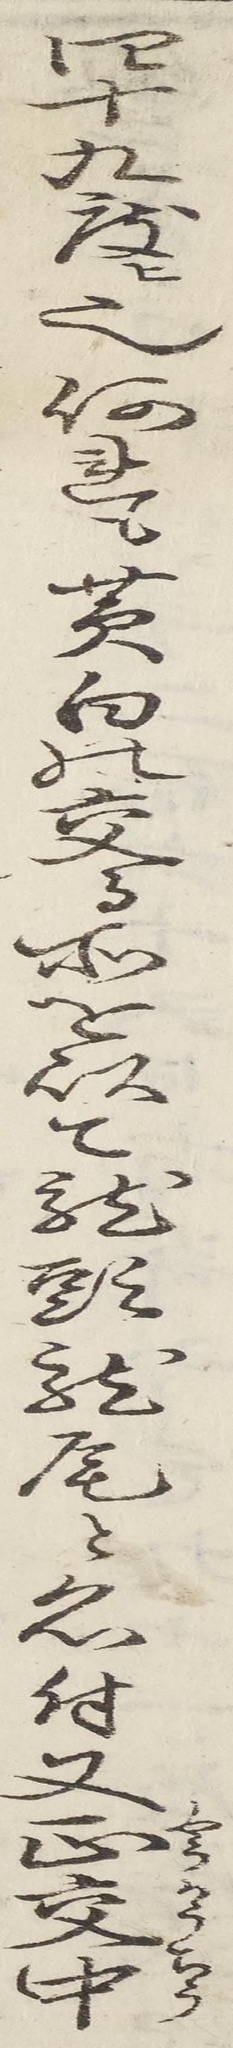四十九度也何れも黄白の交る所を以て龍頭龍尾と名付又正交中
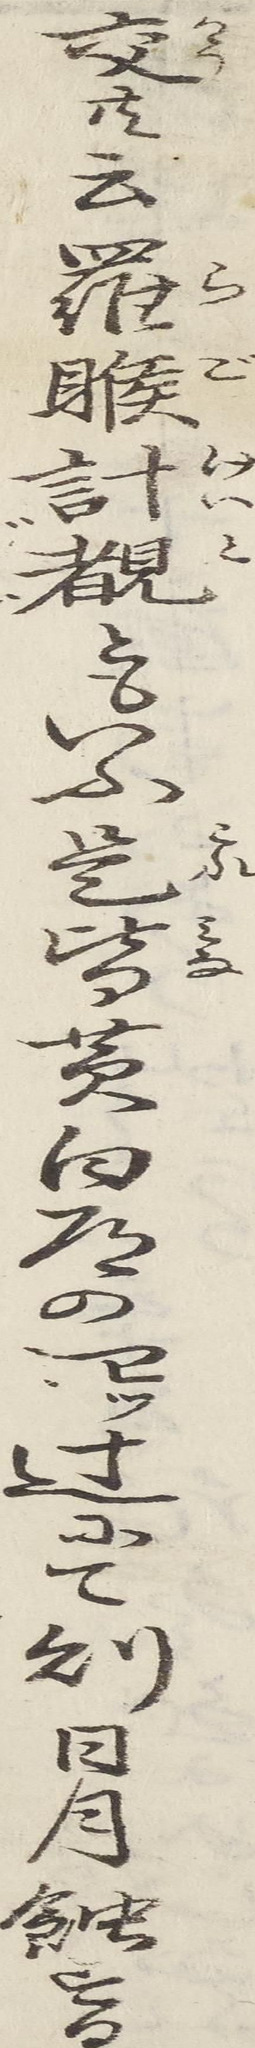交共云羅睺計覩ともいふ是皆黄白道の四ツ辻にて則日月蝕する
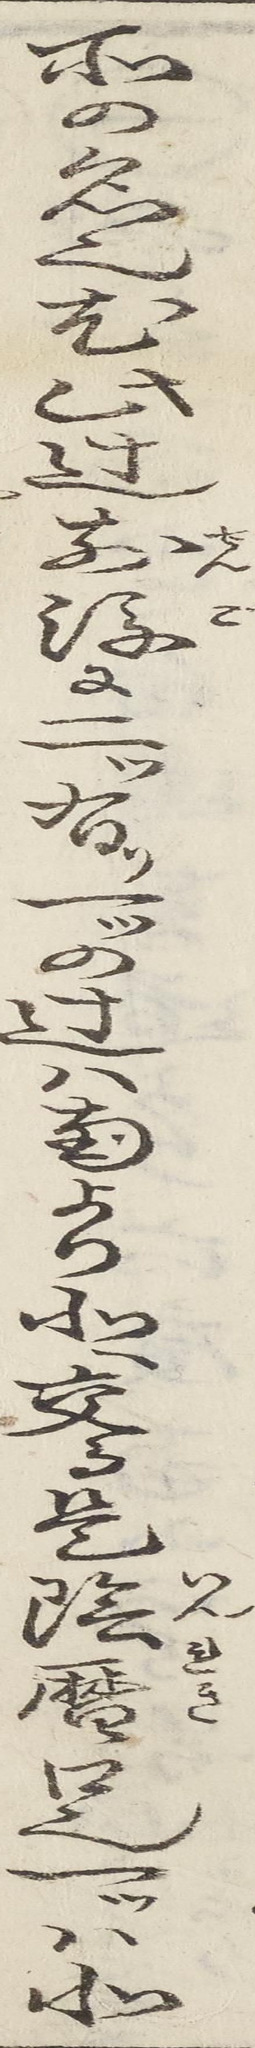所の名也尤此辻前後に二ツ有り一ツの辻は南より北へ交る是陰暦口也一ツは北
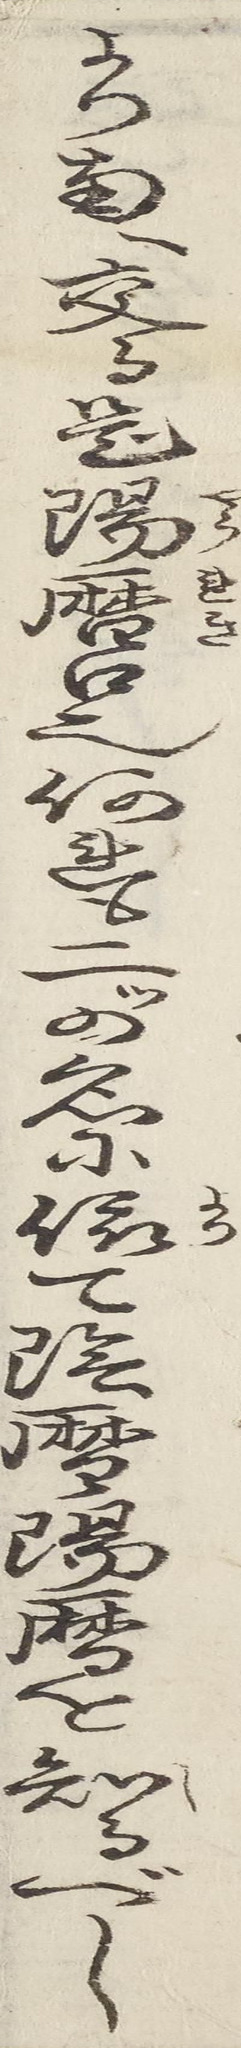より南へ交る是陽暦口也何れも二ツの名に依て陰暦陽暦を知るべし
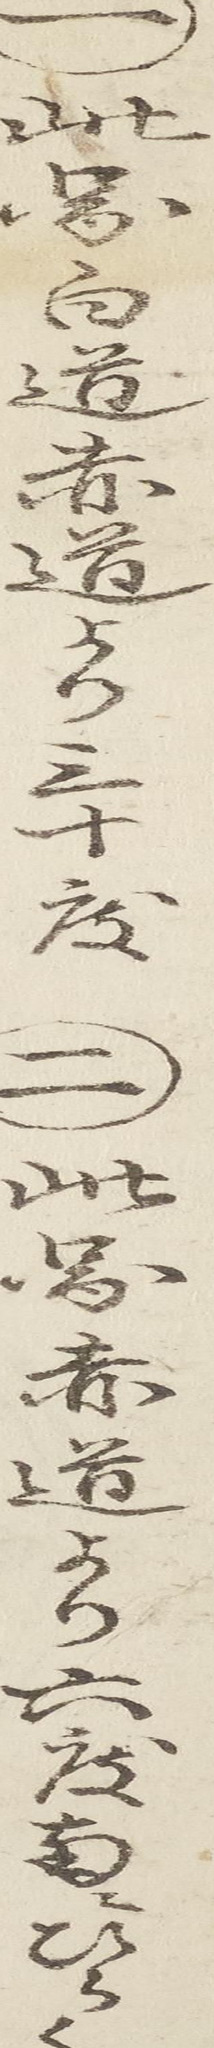㊀此図白道赤道より三十度㋥此図赤道より六度南ニひらく
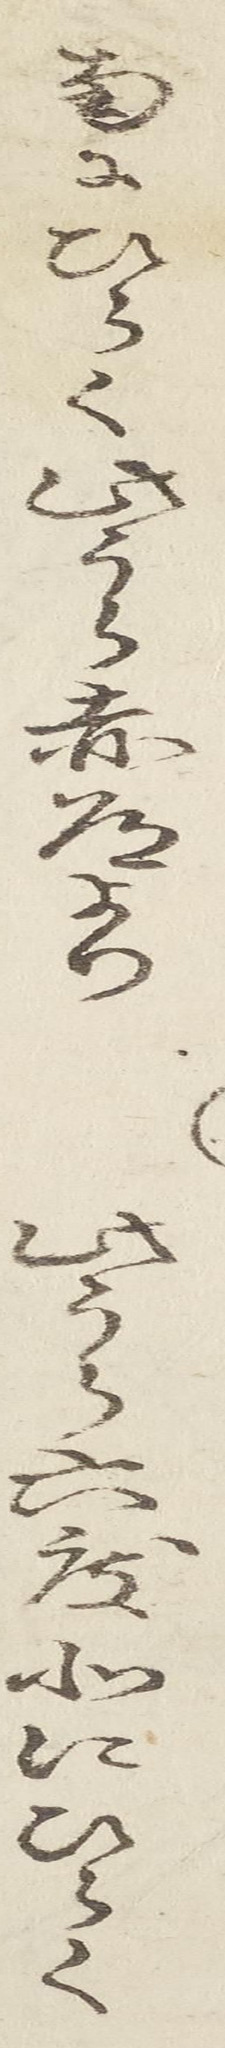南にひらく此うら赤道より此うら六度北にひらく
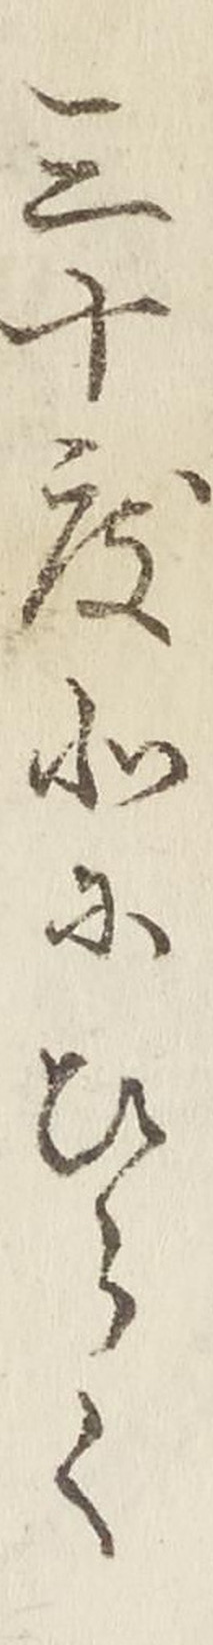三十度北にひらく
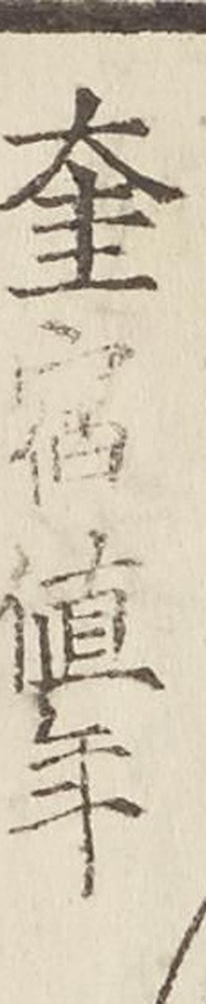奎宿値年
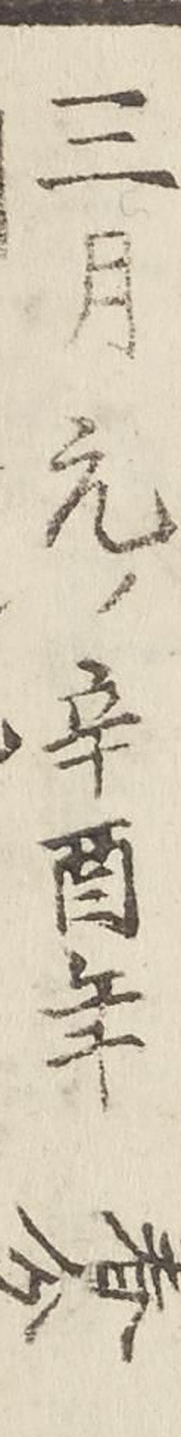三月元ノ辛酉年
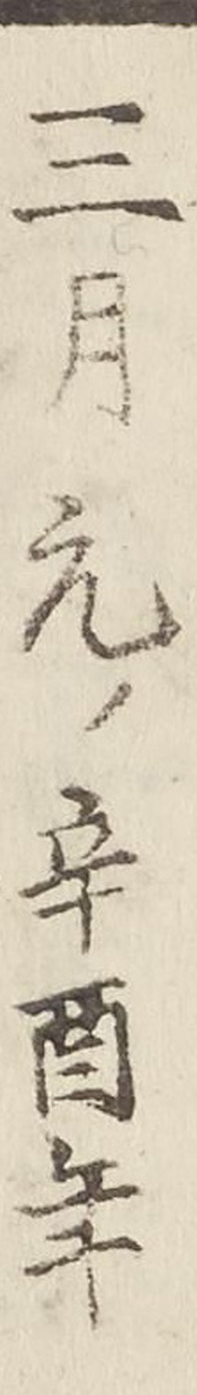三月元ノ辛酉年
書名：平天儀圖解
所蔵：東京大学地震研究所図書室 Earthquake Research Institute Library, The University of Tokyo, JAPAN
